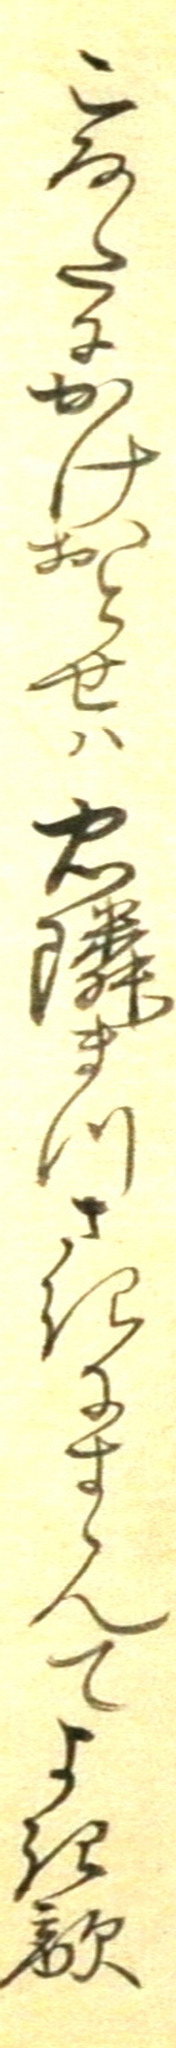こなたにかけおとせは忠隣まつさきにすゝんてよき敵
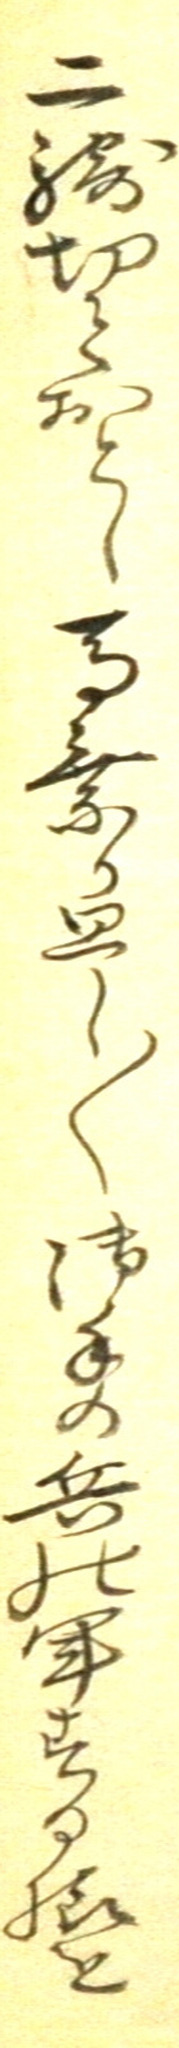二騎切ておとし馬乗り廻し〳〵御手の兵の軍する様を
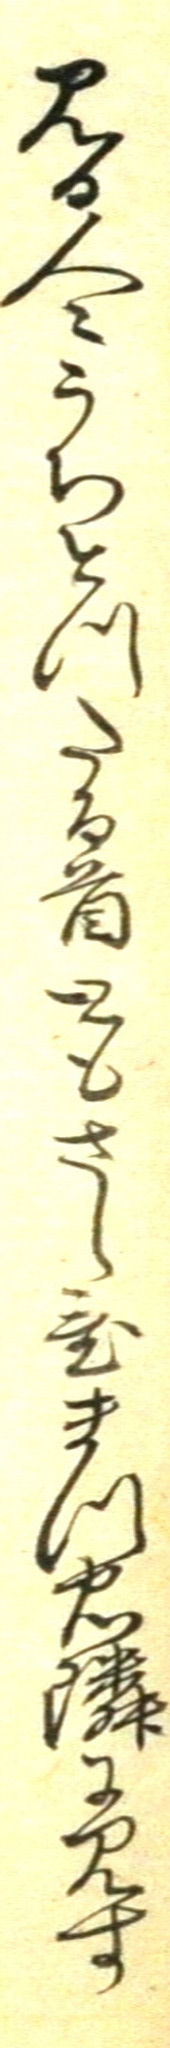見る人々うちとつたる首ともさし置まつ忠隣に見す
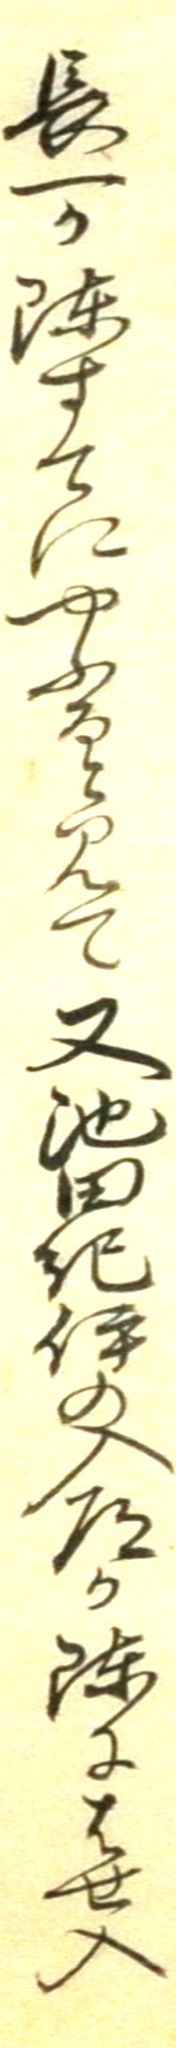長一か陣すてにやふると見て又池田紀伊の入道か陣にはせ入
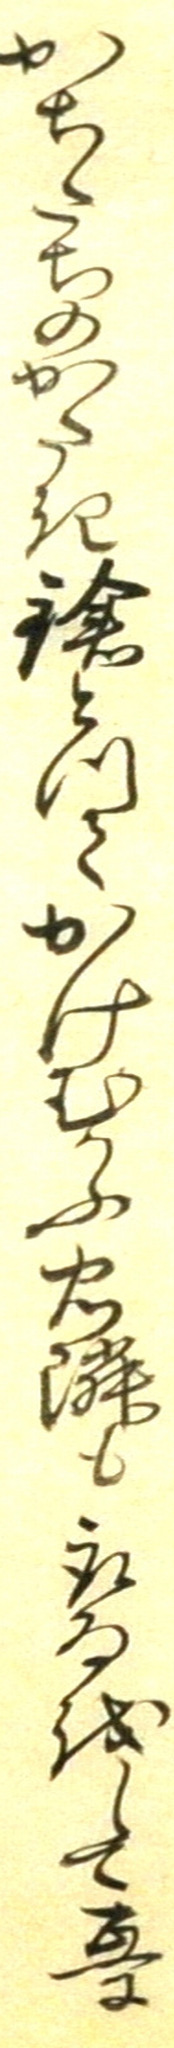かちたちのかたき鎗とつてかけむかふ忠隣も取なをして互に
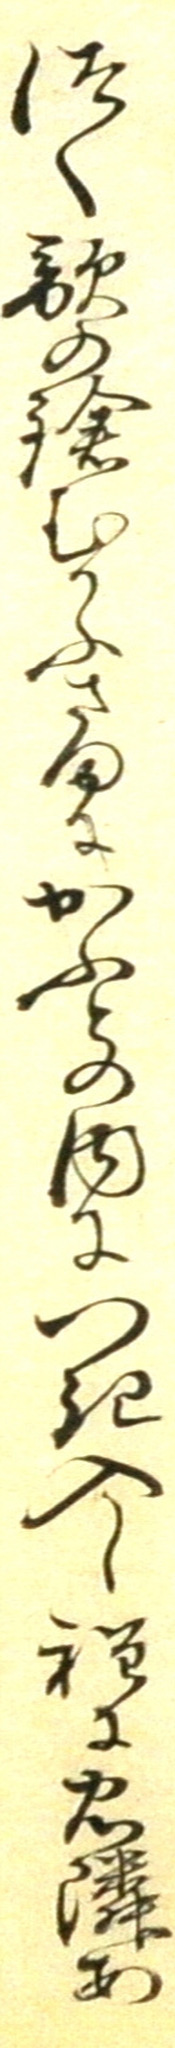つく敵の鎗むかふさまにかふとの内につき入し程に忠隣あ
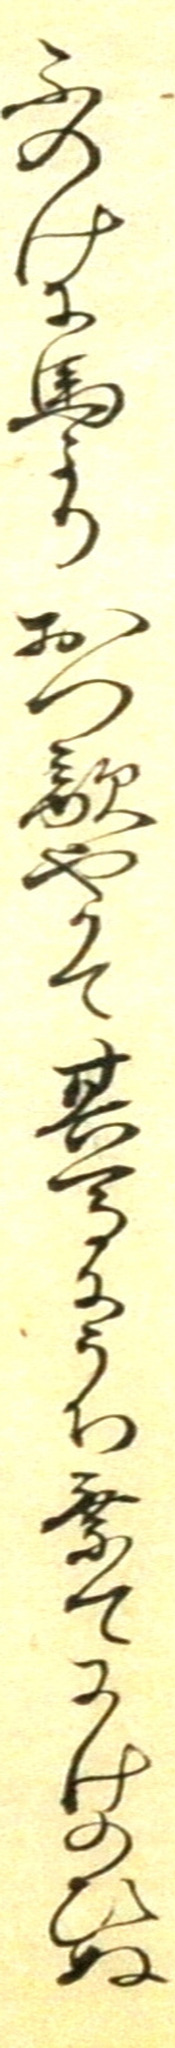ふのけに馬よりおつ敵やかて其馬にうち乗てにけのひぬ
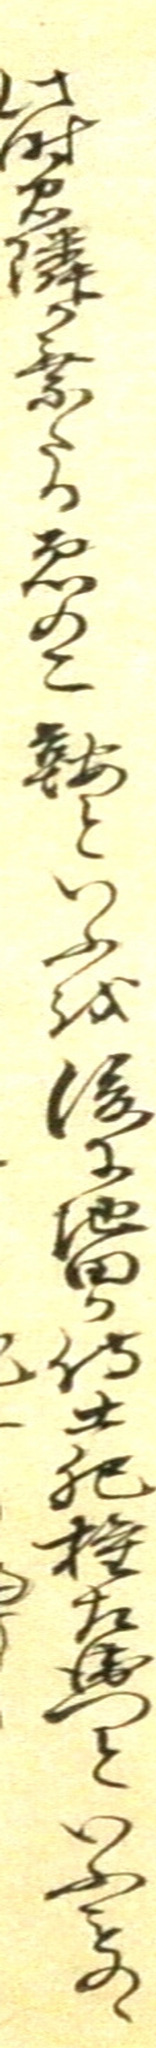此時忠隣か乗たるゑのこ鞍といふを後に池田か侍土肥権左衛門といふものゝ
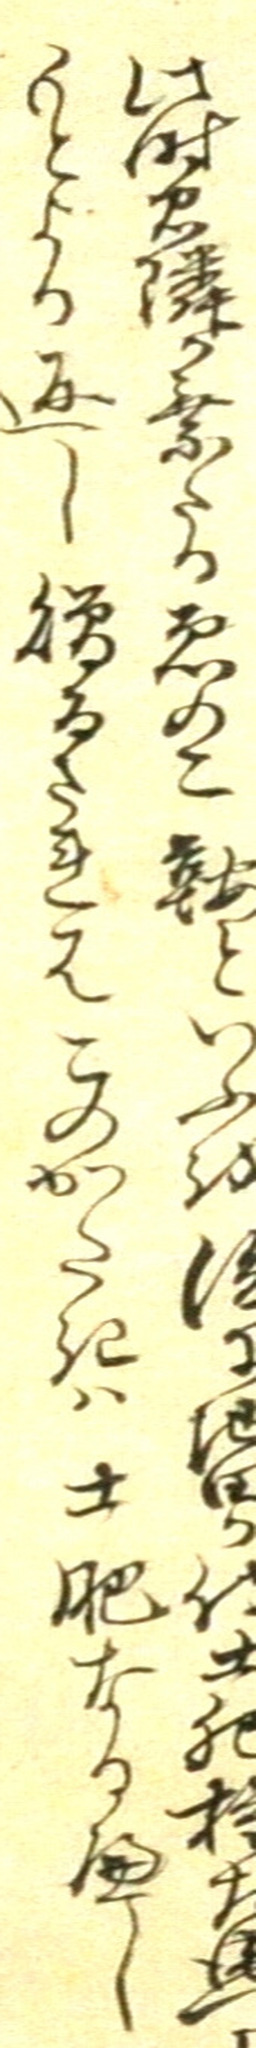もとより返し贈るされはこのかたきは土肥なるへし
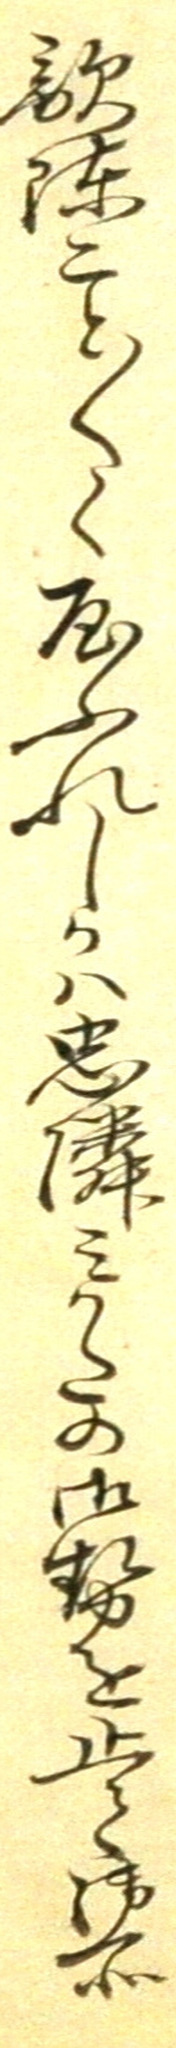敵陣こと〳〵くやふれしかは忠隣みかたの御勢を止て御所
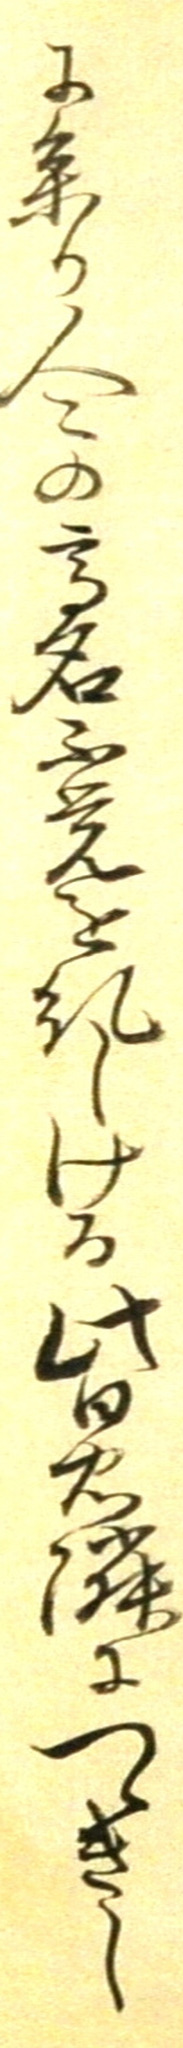に参り人々の高名不覚を糺しける此日忠隣につゝきし
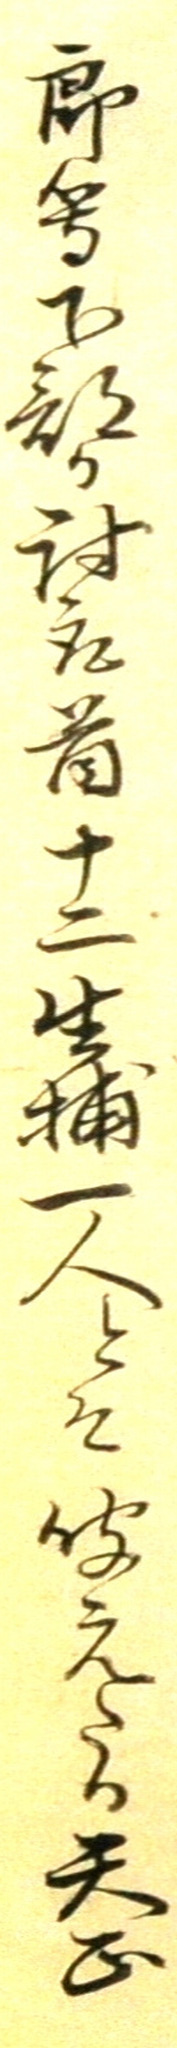郎等下部か討取首十二生捕一人とそ聞えたる天正

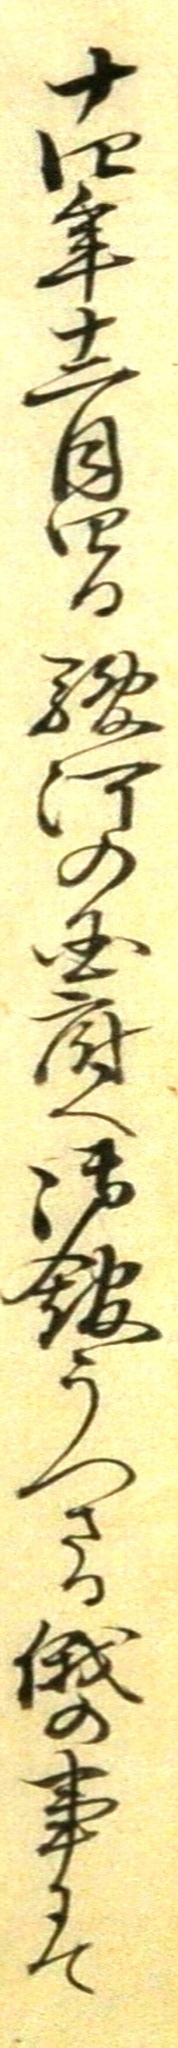十四年十二月四日駿河の国府へ御舘うつさる俄の事にて
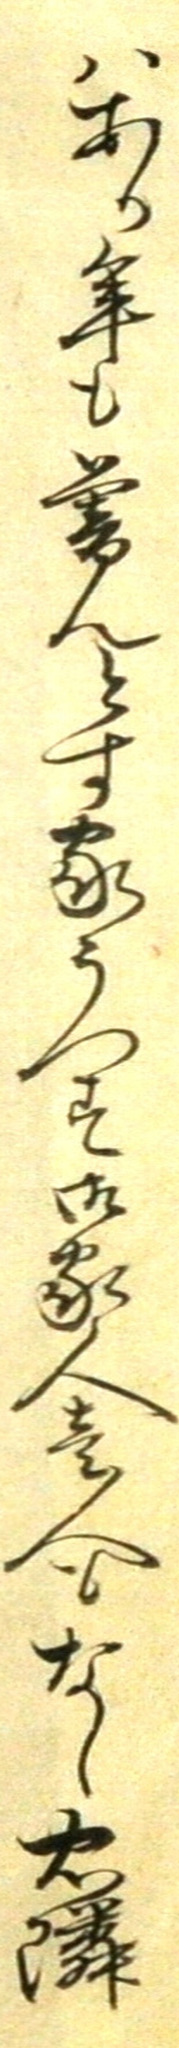はあり年も暮んとす家うつす御家人壱人もなし忠隣
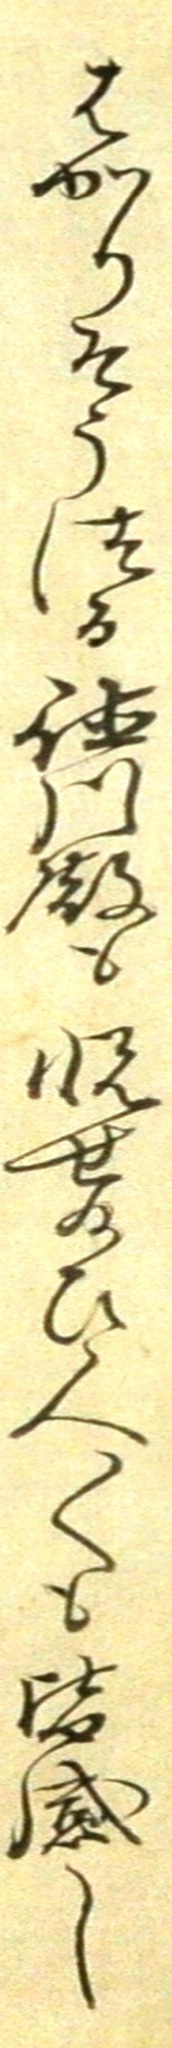はかりそうつる徳川殿も悦せ給ひ人〳〵も皆感し
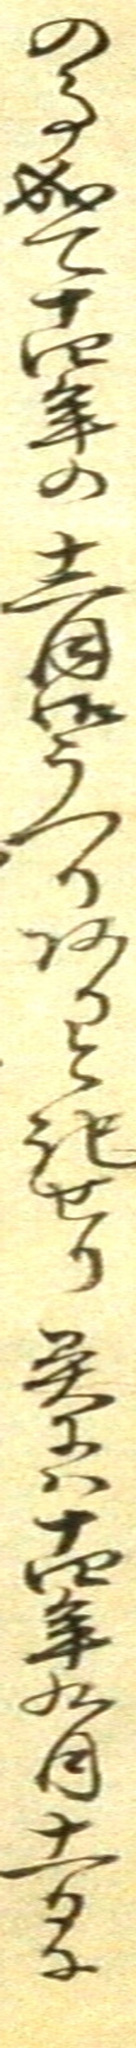の事成て十四年の十二月御うつりありと記せり異には十四年九月十一日に
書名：藩翰譜（四・中）
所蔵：伊那市立高遠町図書館・合同会社AMANE
